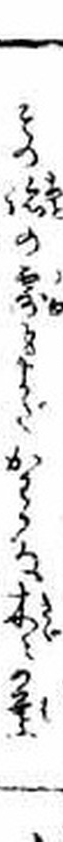その後の露もまだかはらぬ木々の葉蓮
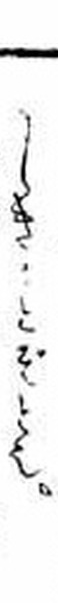しきことぞと也
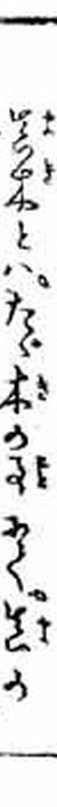真木とはたゞ木の事にて真の
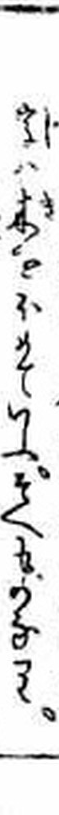字は木をほめてほめていふそへものなり
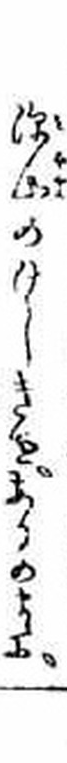深山のけしきをありのまゝに
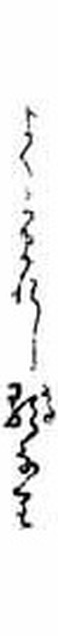よくよまれし歌なり

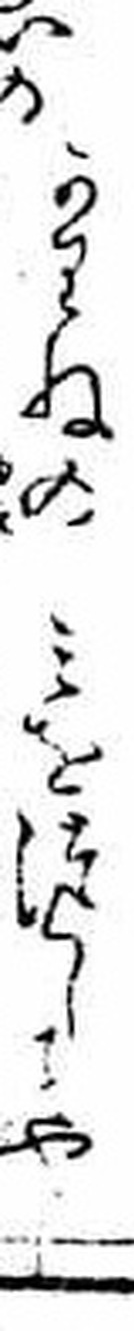かりねのみをつくしてや
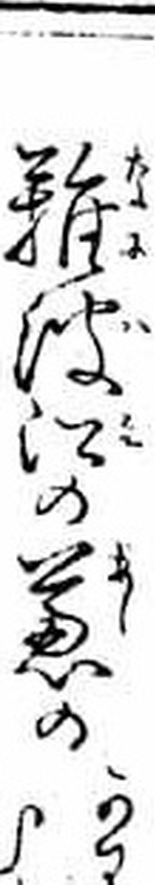難波江の葦の
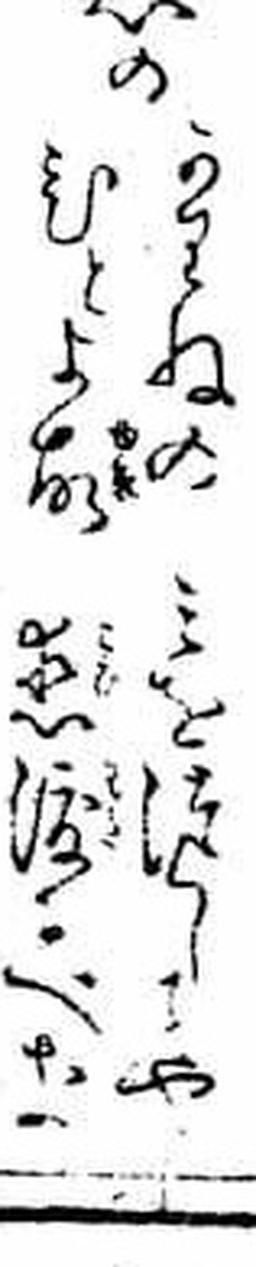ひとよ故恋わたるべき
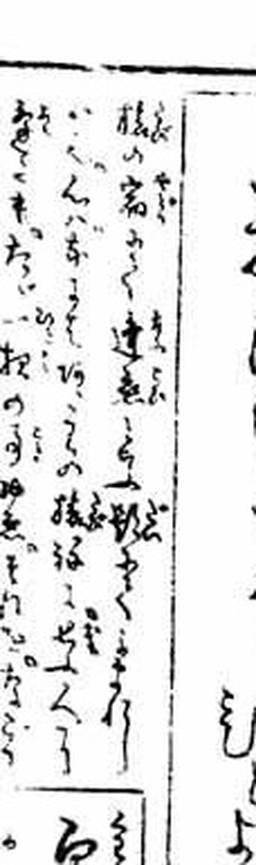旅の宿にて逢恋といふ題にてよまれ行程
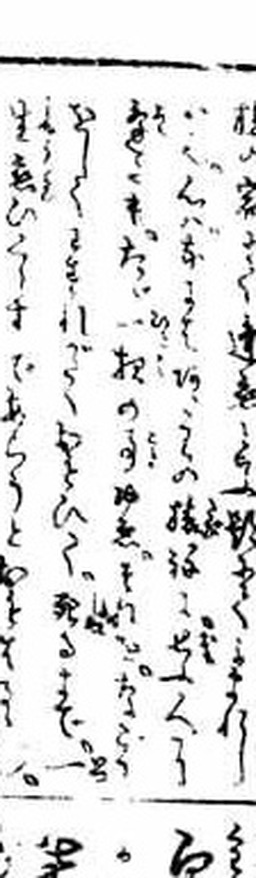逢てもたゞ一夜の事ゆゑそれをなごり
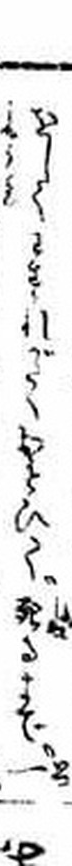をしくわかれがたくおもひて死るまで一嘉
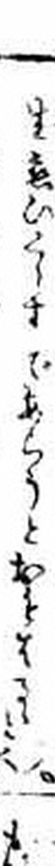生恋ひくらすであらうとおもはるゝと也
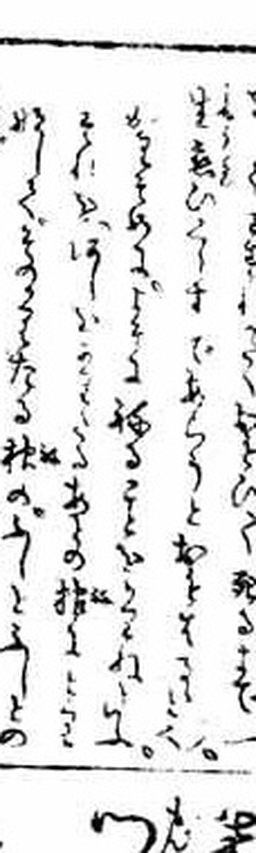かりそめによそにねることをかりねといふ門
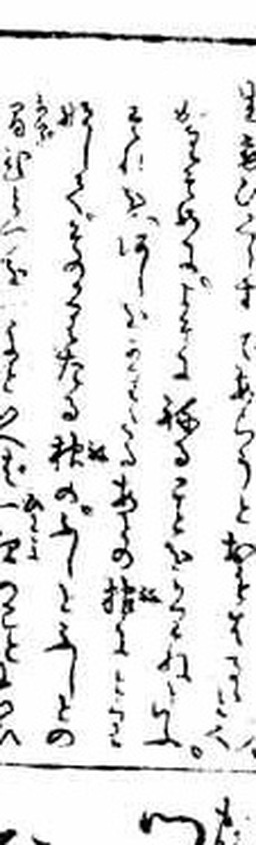それをあしをわりたるあしの根にとり院
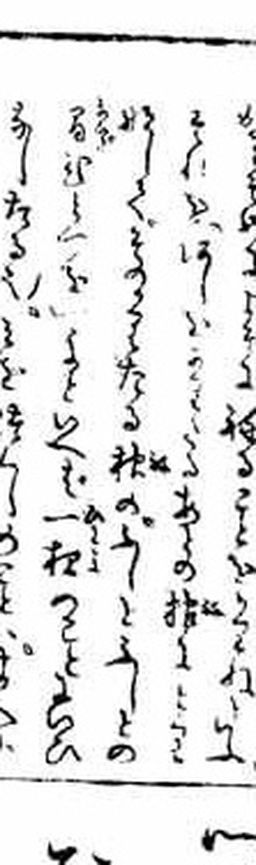なしてそのかりたる根のふしとふしとの
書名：小倉百人一首
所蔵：東京学芸大学教育コンテンツアーカイブ
